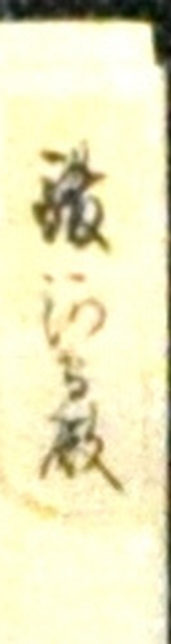駿河守殿
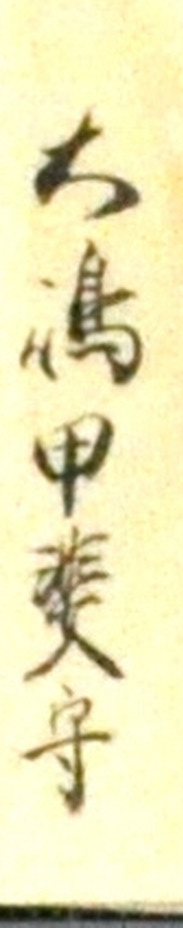大島甲斐守

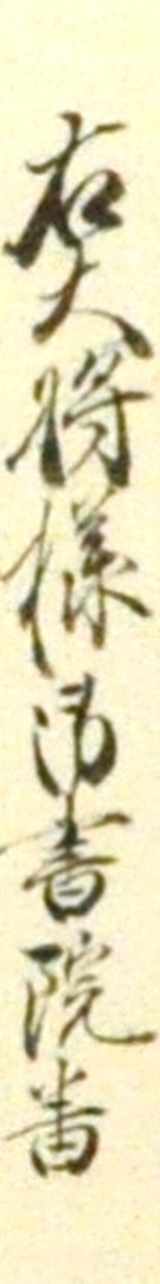右大将様御書院番
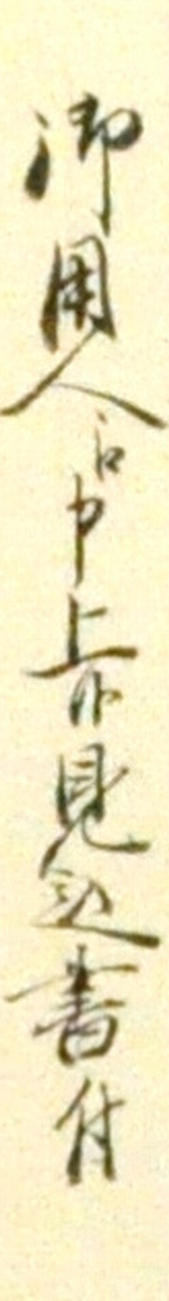御用人え申上候見込書付
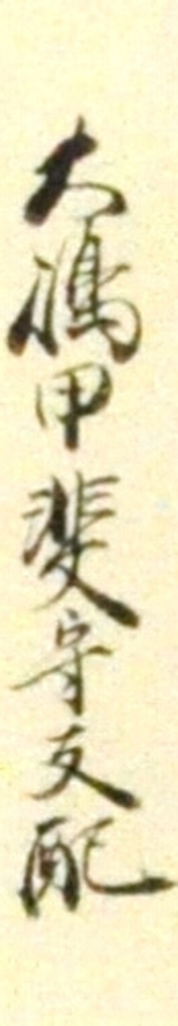大島甲斐守支配
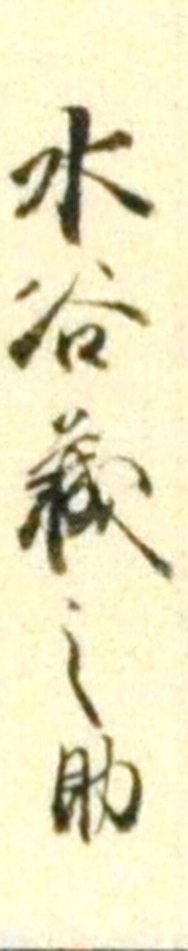水谷蔵之助
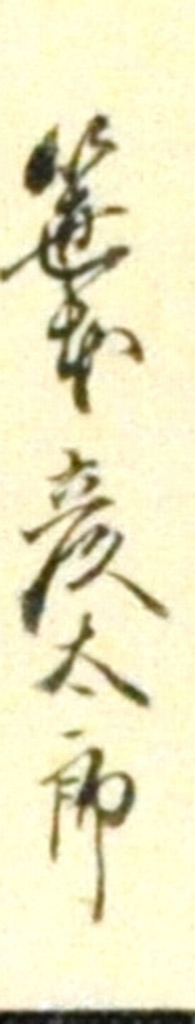笹本彦太郎
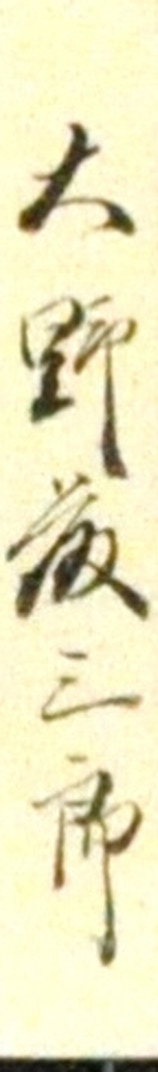大野藤三郎
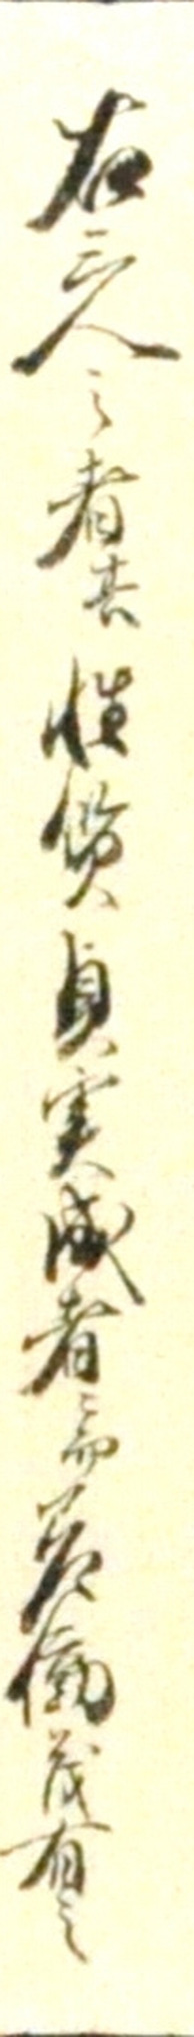右三人之者共性質貞実成者にて差働も有之
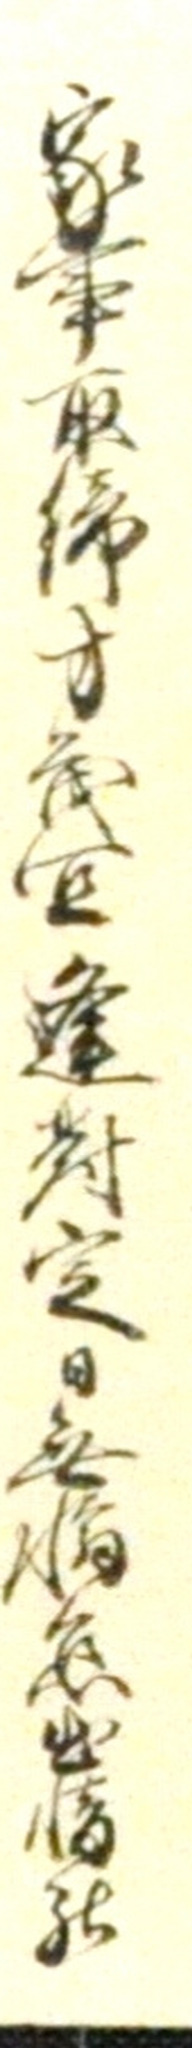家事取締方も宜逢対定日無懈怠出精罷
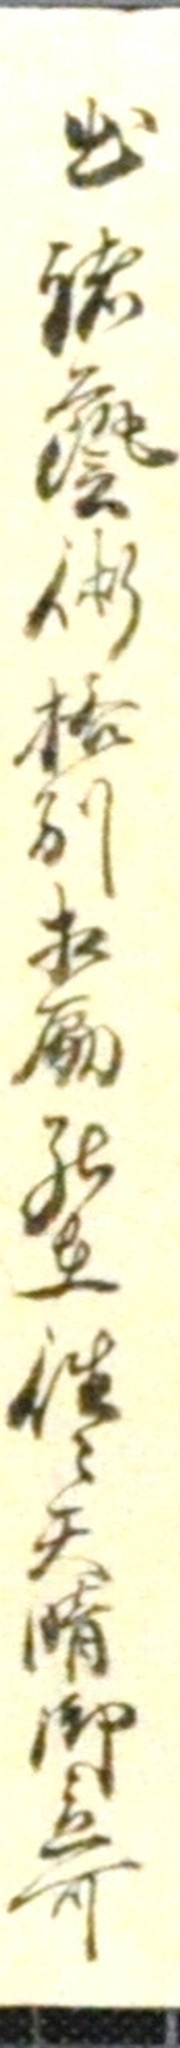出諸芸術格別相励罷在往々天晴御立可
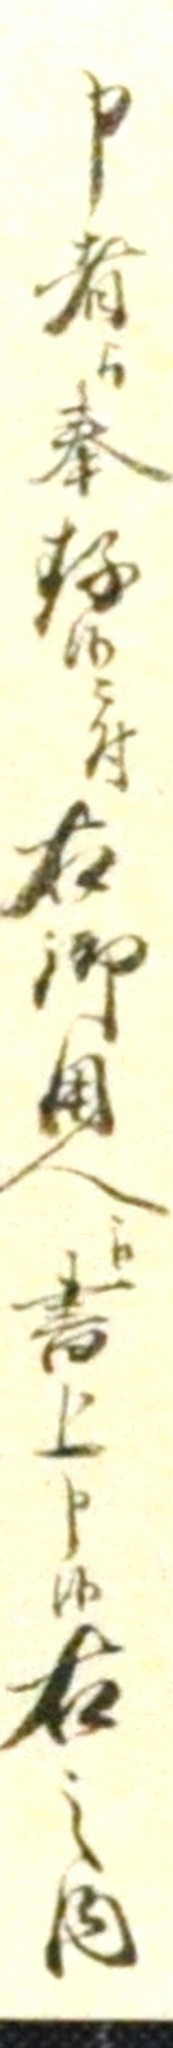申者と奉存候に付右御用人え書上申候右之内
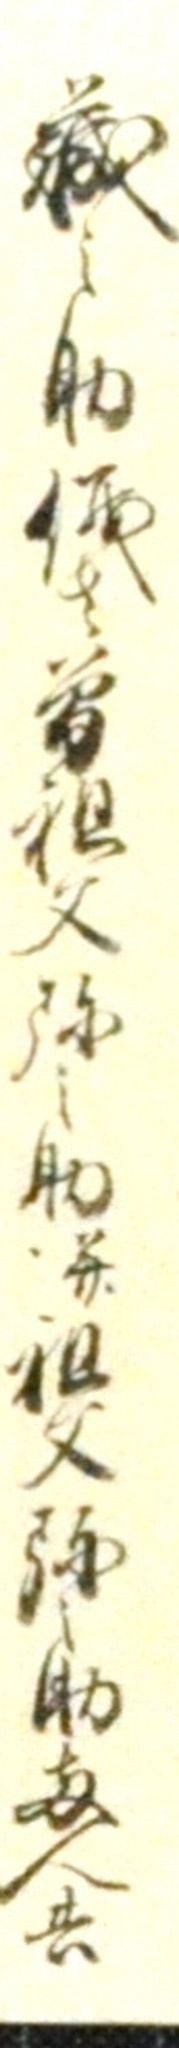蔵之助儀は曾祖父弥之助并祖父弥之助両人共
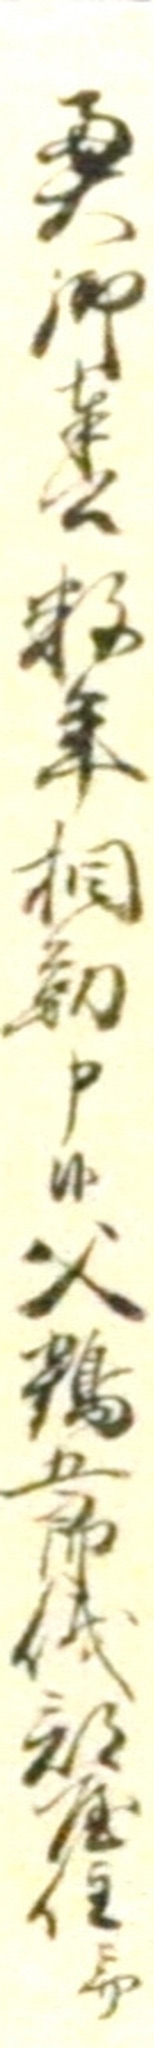奥御奉公数年相勤申候父鶴五郎儀部屋住にて
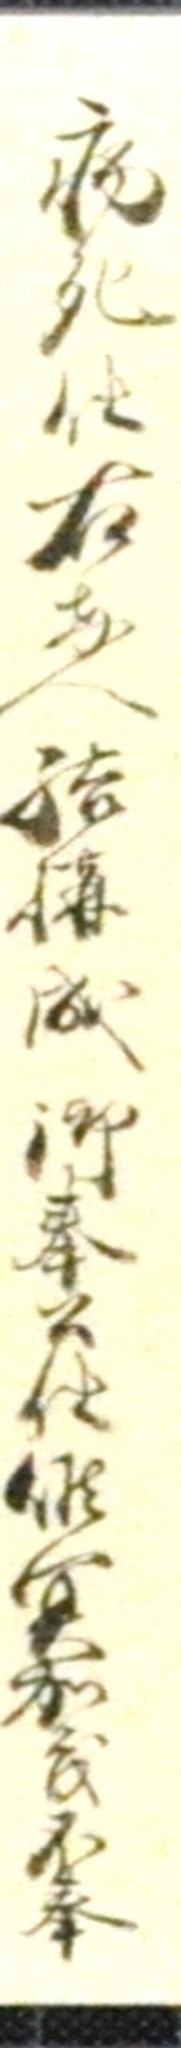病死仕右両人結構成御奉公仕候冥加も不奉
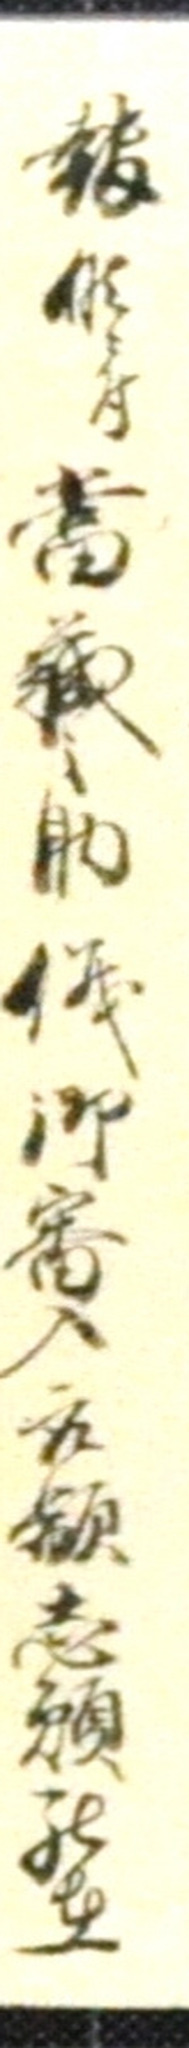報候に付当蔵之助儀御審入取頻志願罷在
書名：右大将様御書院番御用人見込書付
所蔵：伊那市立高遠町図書館・合同会社AMANE
